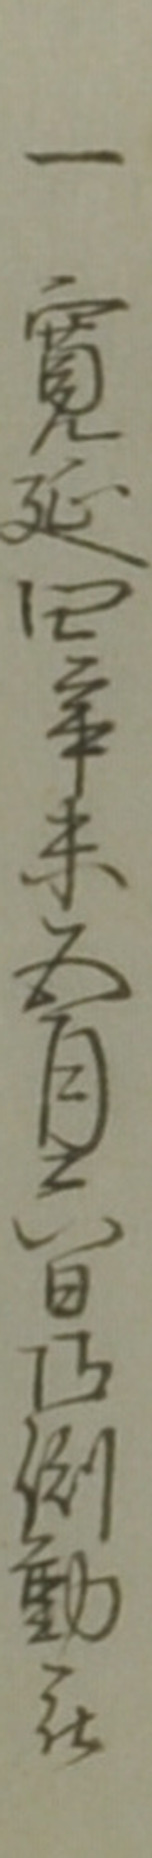一寛延四辛未五月六日御側勤被
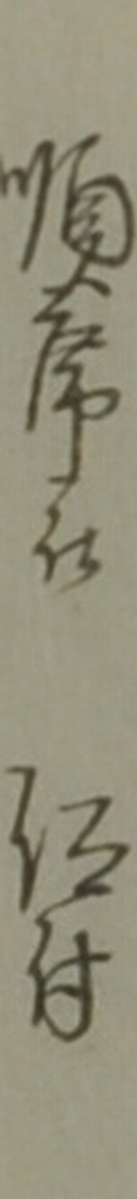順序被仰付
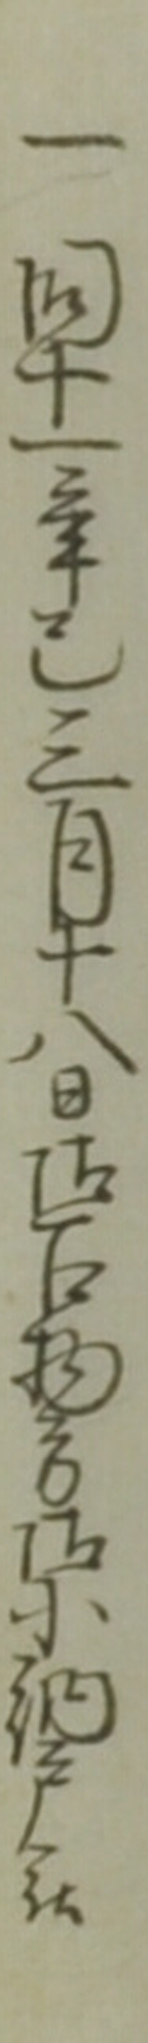一同十一辛巳三月十八日御召物方御小納戸被
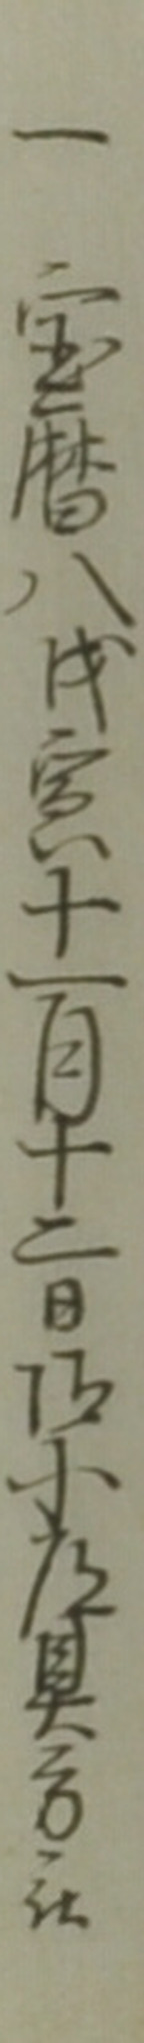一宝暦八戊寅十一月十二日御小道具方被
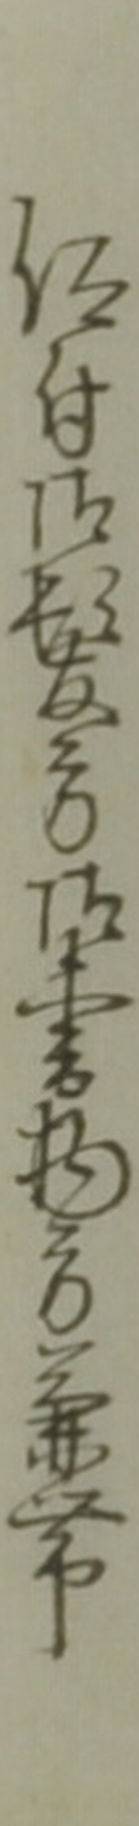仰付御髪方御書物方兼帯

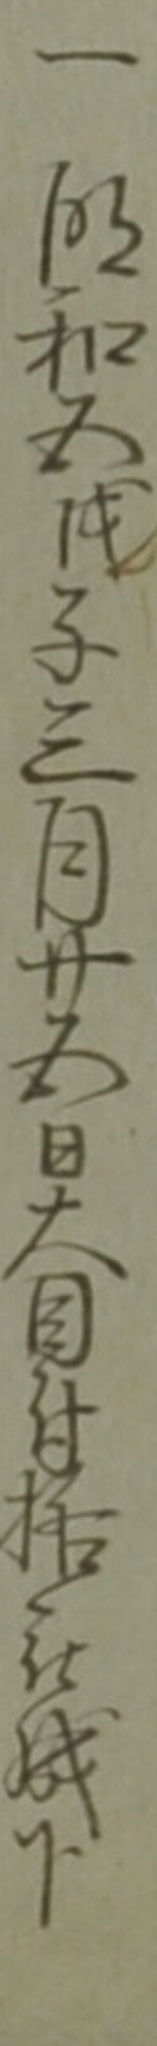一明和五戊子三月廿五日大目付格被成下
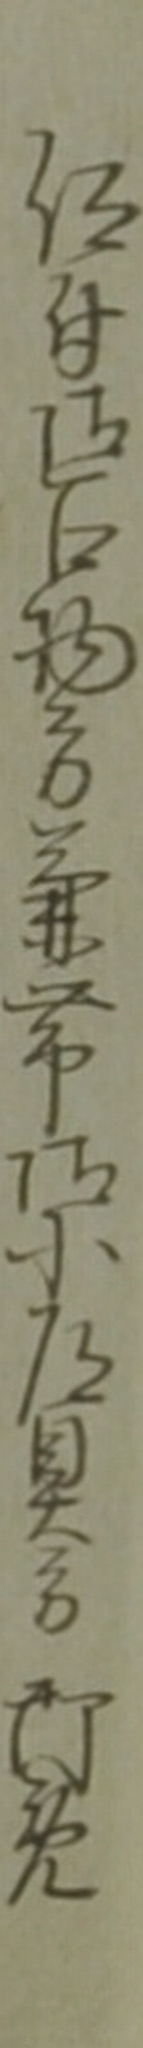仰付御召物方兼帯御小道具方御免
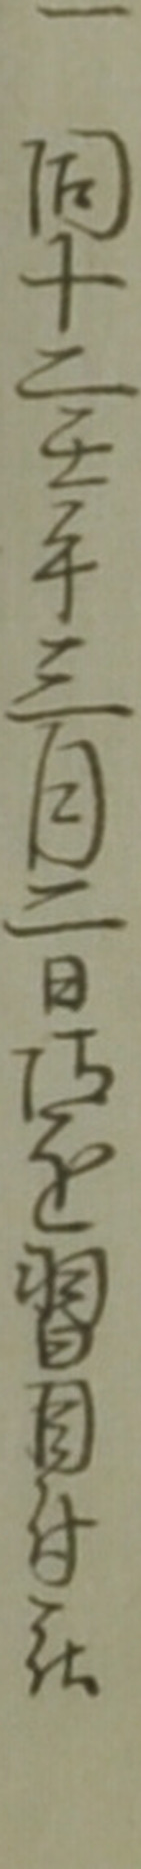一同十二壬午三月二日御近習目付被
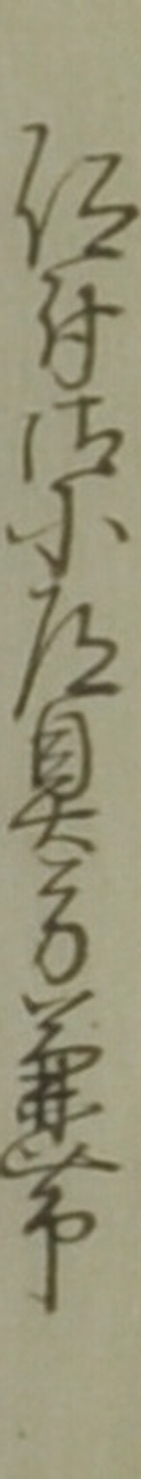仰付御小道具方兼帯
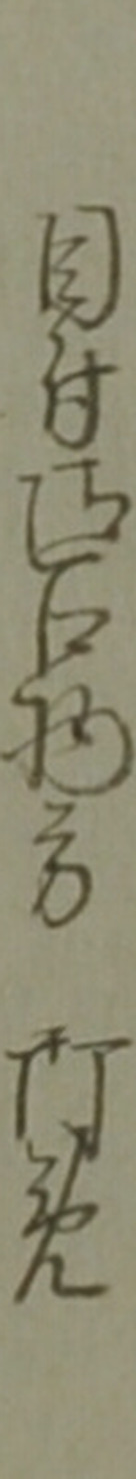目付御召物方御免
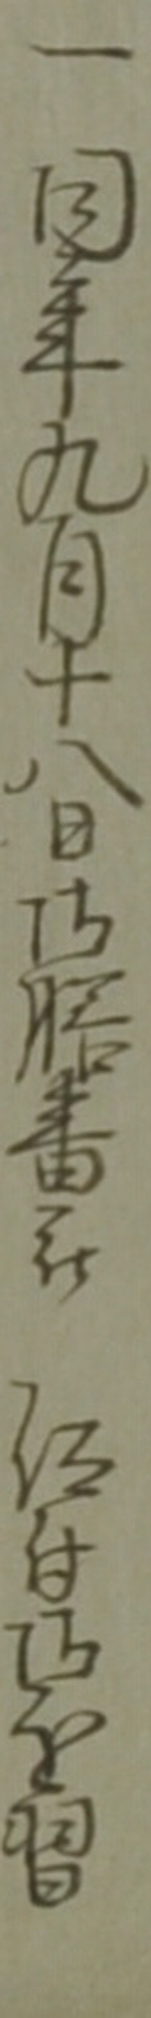一同年九月十八日御膳番被仰付御近習
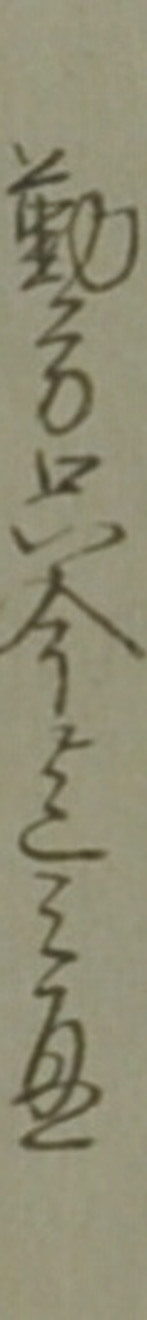勤方只今迄之通
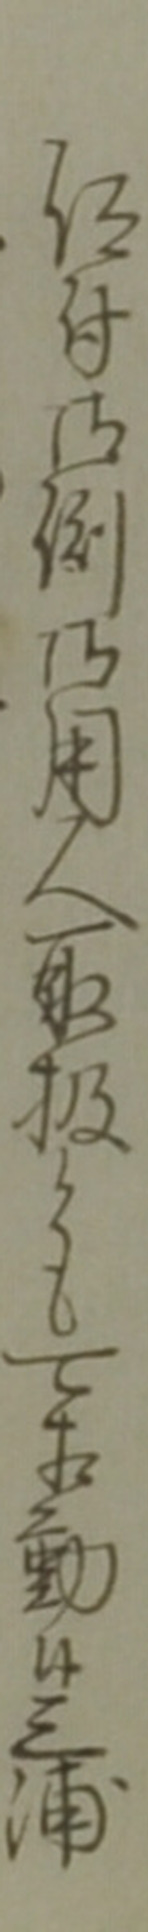仰付御側御用人取扱とも可相勤候三浦
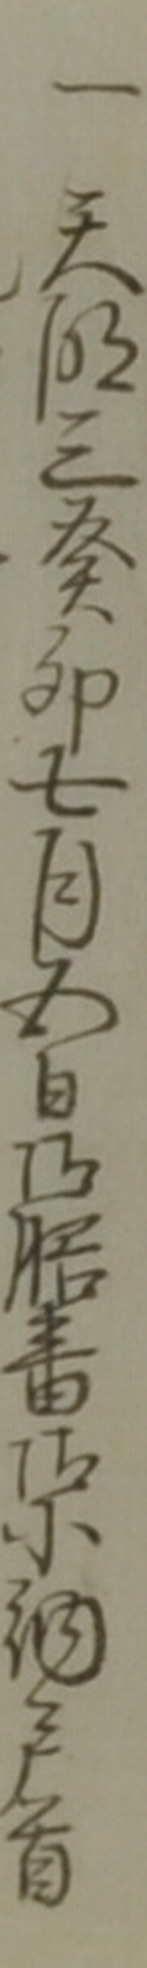一天明三癸卯七月五日御膳番御小納戸首
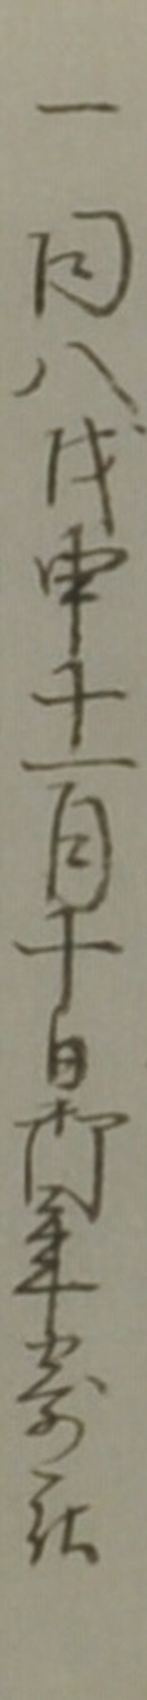一同八戊申十一月十日御年寄被
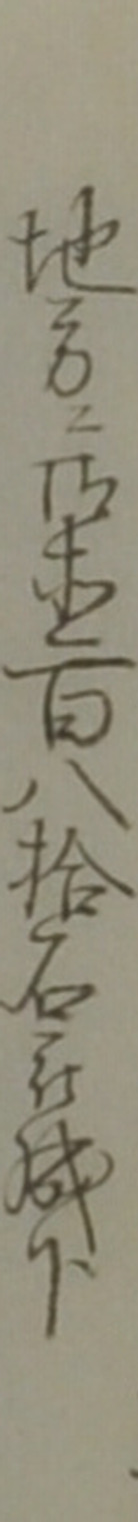地方ニ御直百八拾石被成下
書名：給人諸士勤仕録（三）
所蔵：伊那市立高遠町図書館・合同会社AMANE
